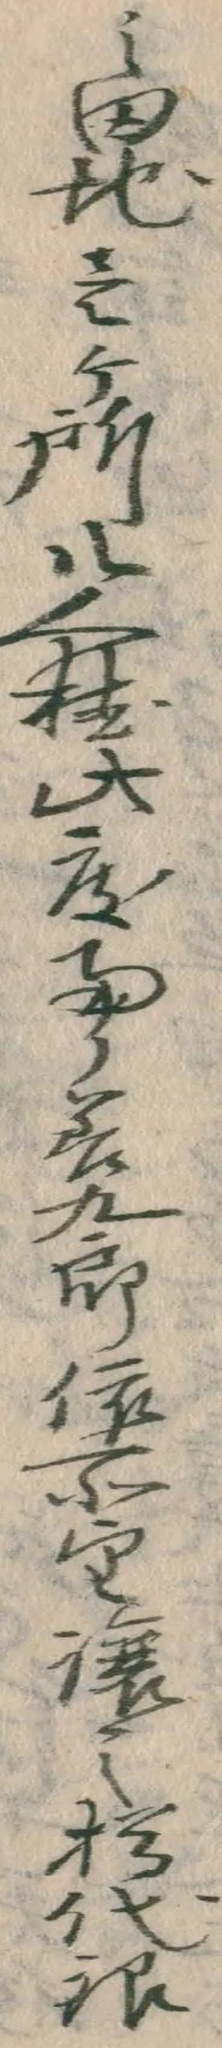之田地壱ケ所八人植此度南ノ善九郎依所望譲也樽代銀
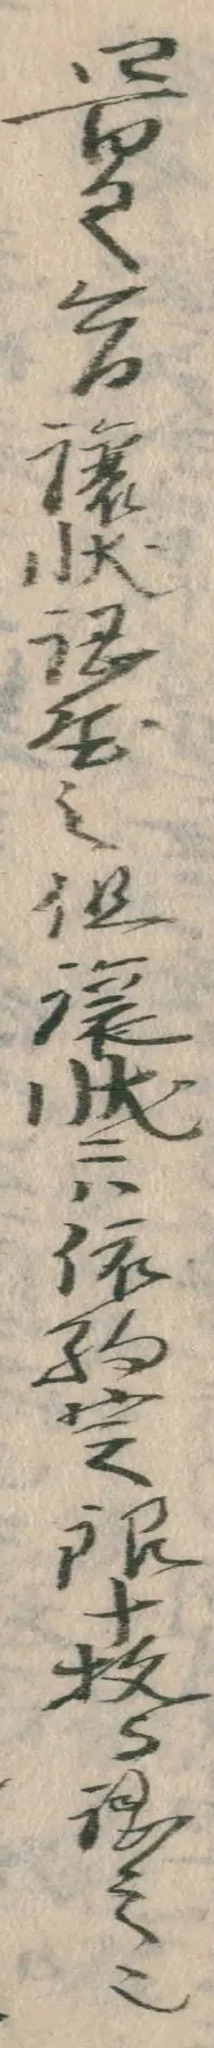四百匁今日譲状認置也但譲状ニハ依約定銀十枚と認之也
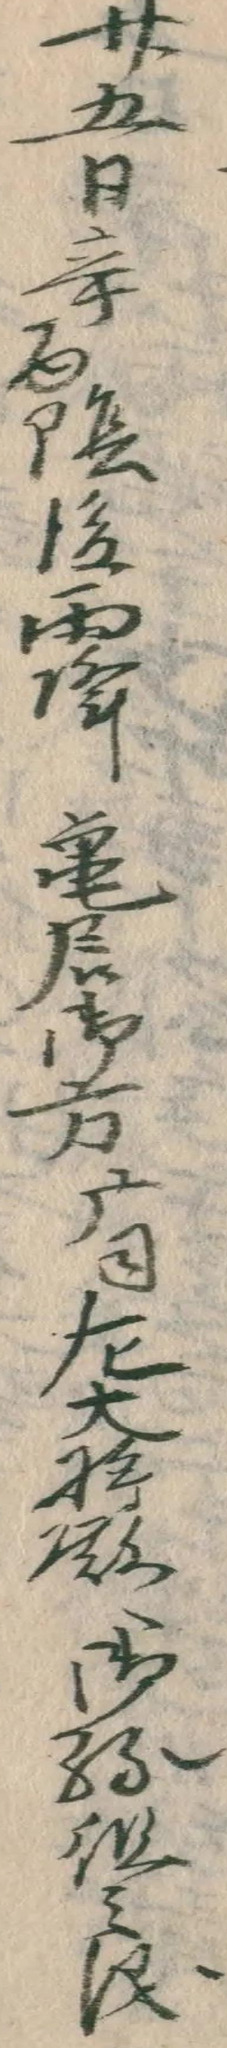廿五日辛酉陰後雨降亀君御方鷹司左大将殿へ御縁組之儀
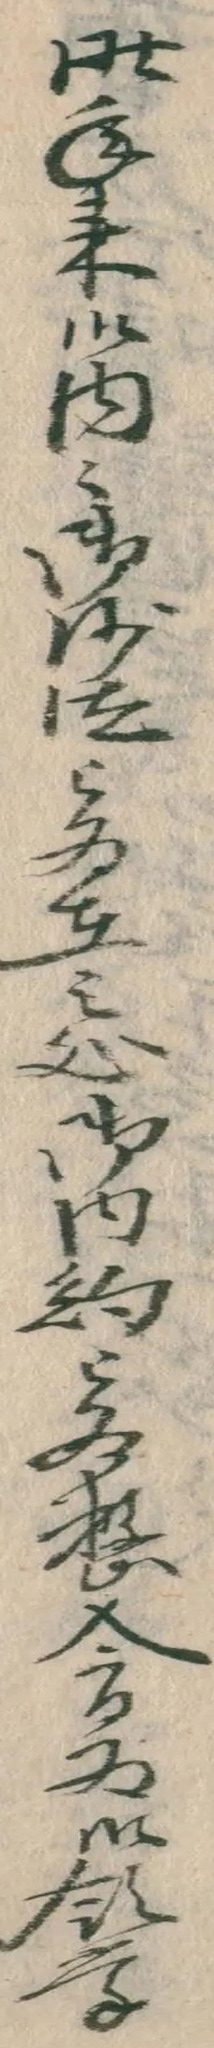昨年来御内々御沙汰被為在之処御内約被為懇今日為候領掌
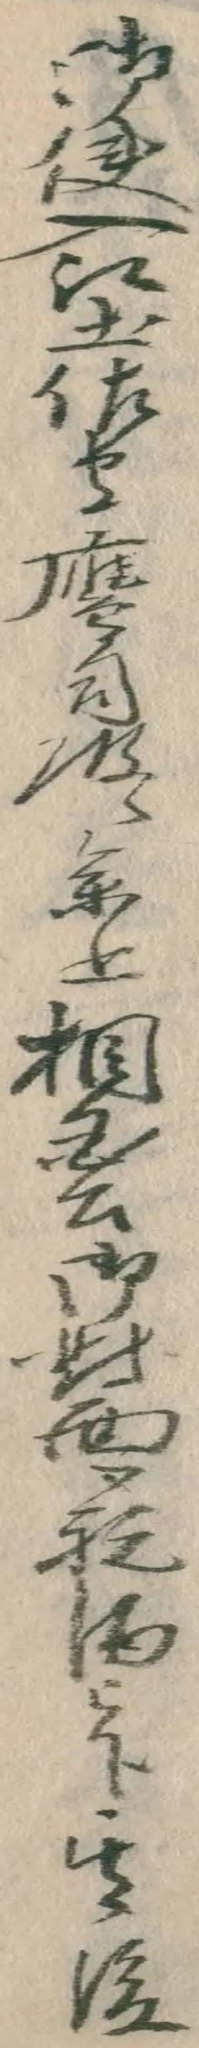御使入江土佐守鷹司殿へ参上相国公御對面御祝酒被下其後
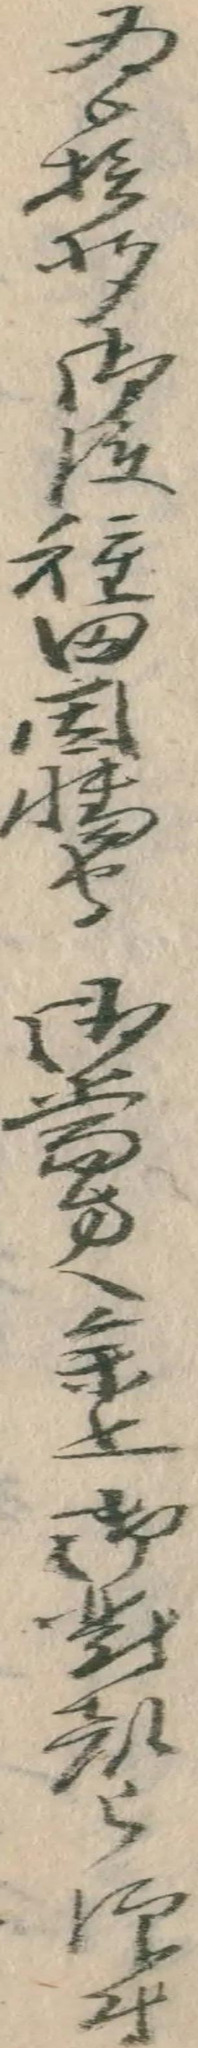為御挨拶御使種田因幡守御當方へ参上御對顔被仰付
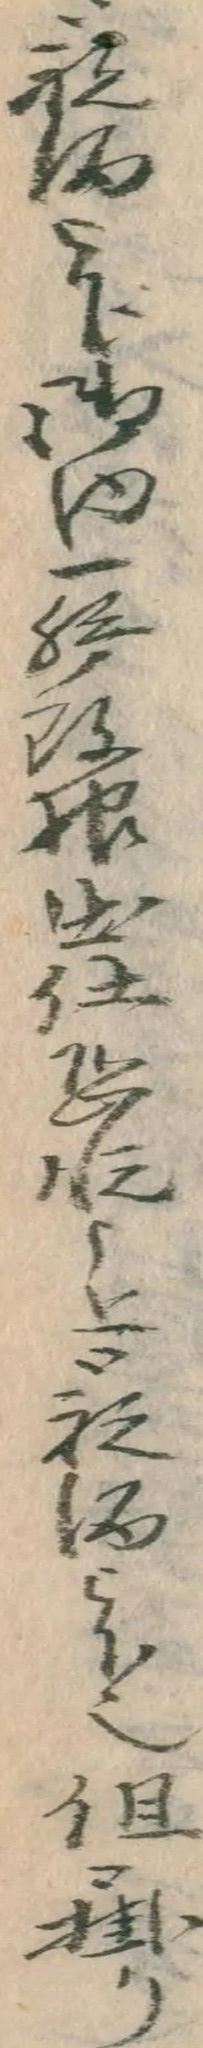御祝酒被下御内一統改服出仕恐悦申上候祝酒被下也但掛り

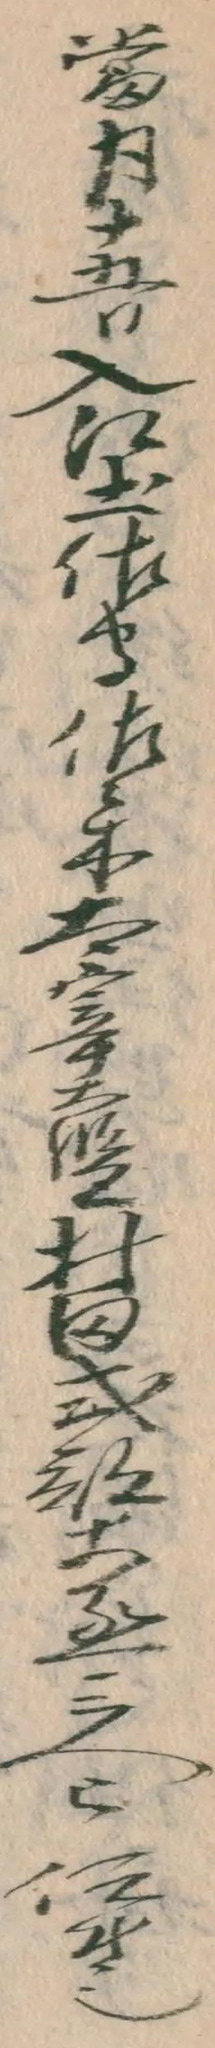當月十五日入江土佐守佐々木太宰大監村田式部大丞三人被仰付也
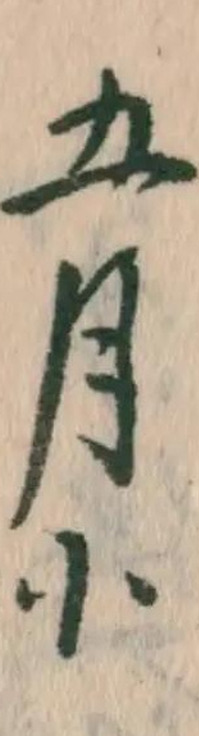五月小
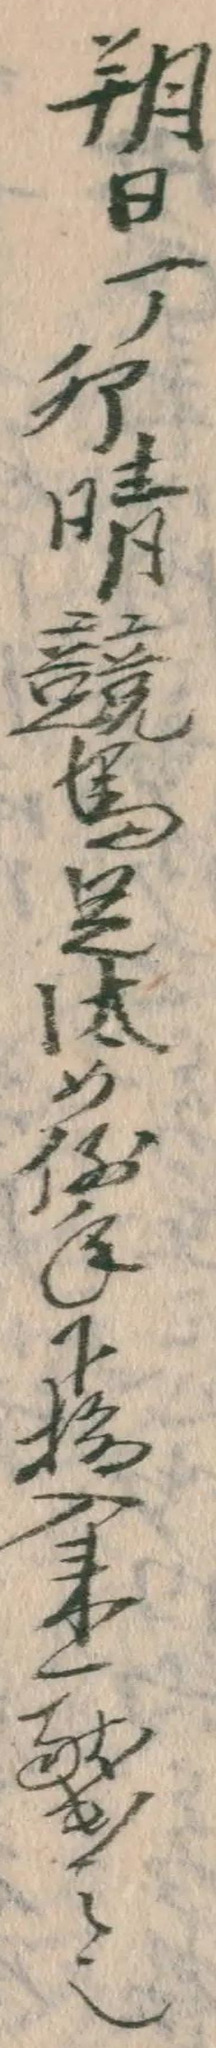朔日丁卯晴競馬足汰如例年下橋入来一献出之也
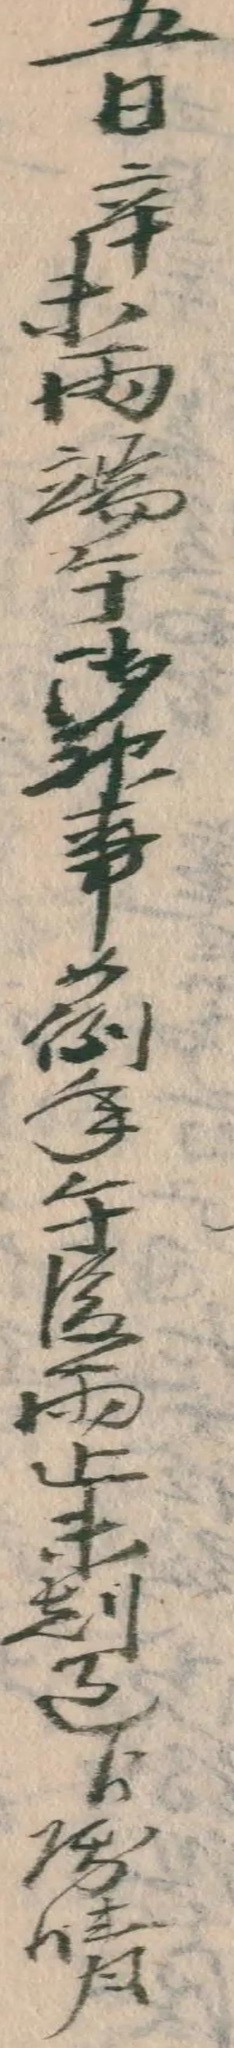五日辛未雨端午御神事如例年午後雨止未刻過ゟ属晴
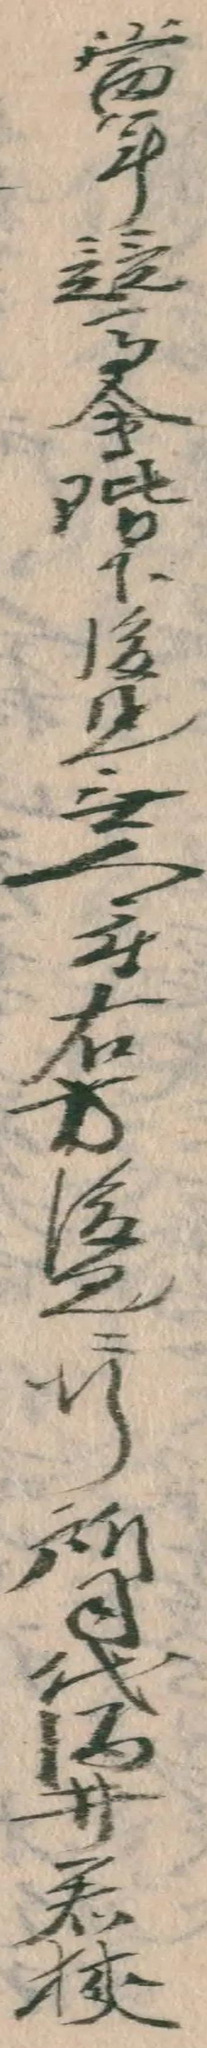當年競馬會階下後見無人ニ付右方後見ニ行所司代酒井若狭
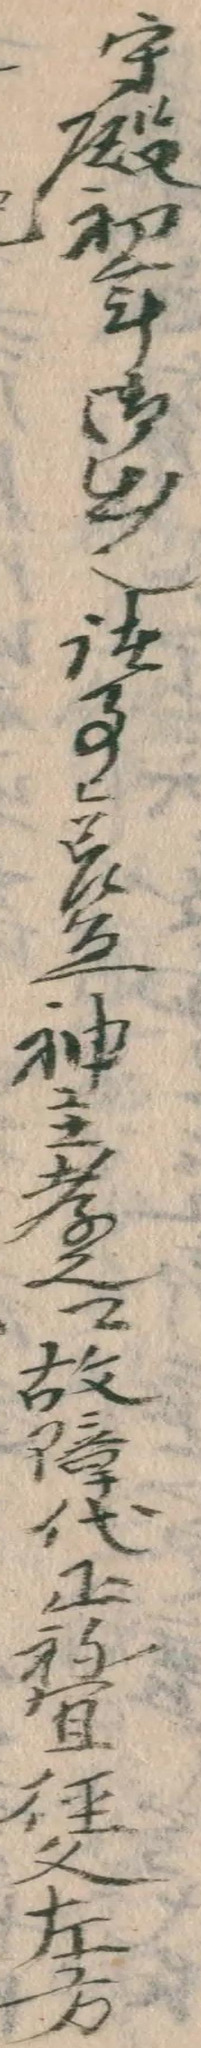守殿初年御出也諸事被差過神主孝久卿故障代正祢宜径久左方
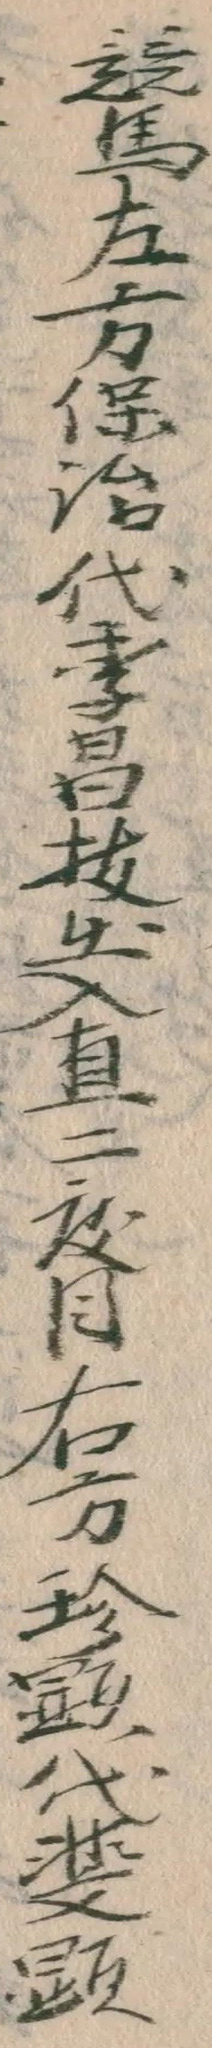競馬左方保治代季昌抜出入直二度目右方珍顕代斐顕
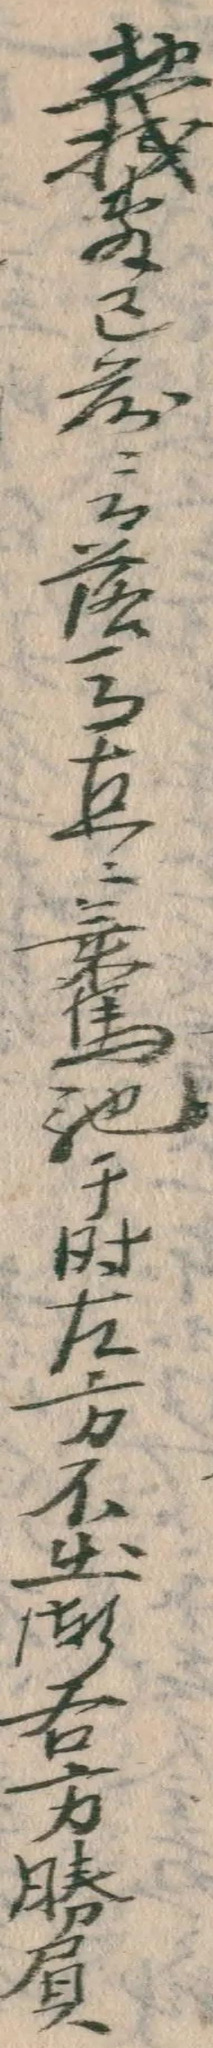惣桟敷已前ニ而落高直ニ乗馬馳于時左方不出漸右方勝負
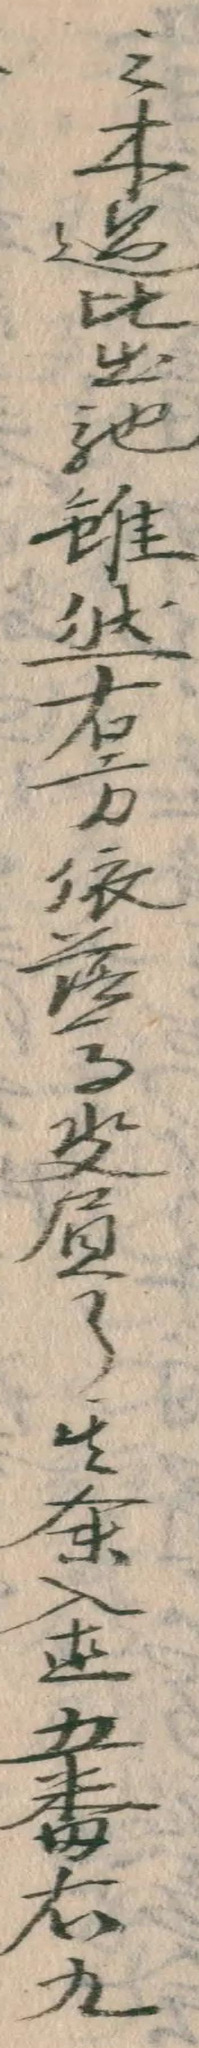之木過比出馳雖然右方依落馬斐負了其余入直五番右九
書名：賀茂社記録. 第69冊
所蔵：国立国会図書館 National Diet Library, JAPAN
